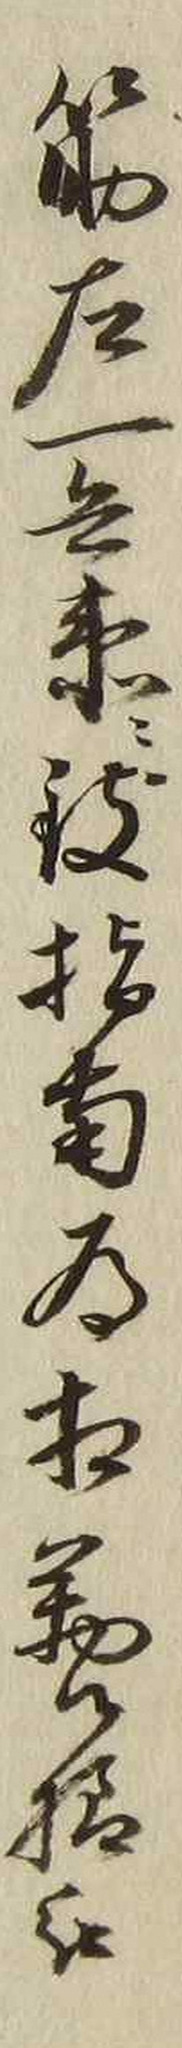筋左一兵衛ニ致指南為相勤候様被
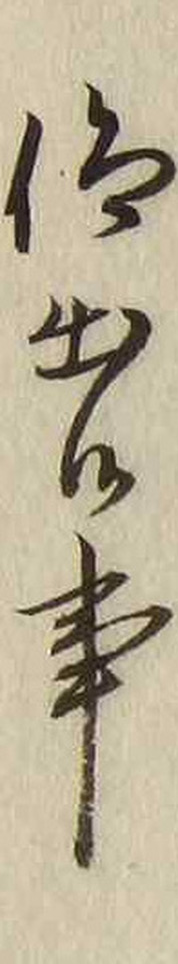仰出候事

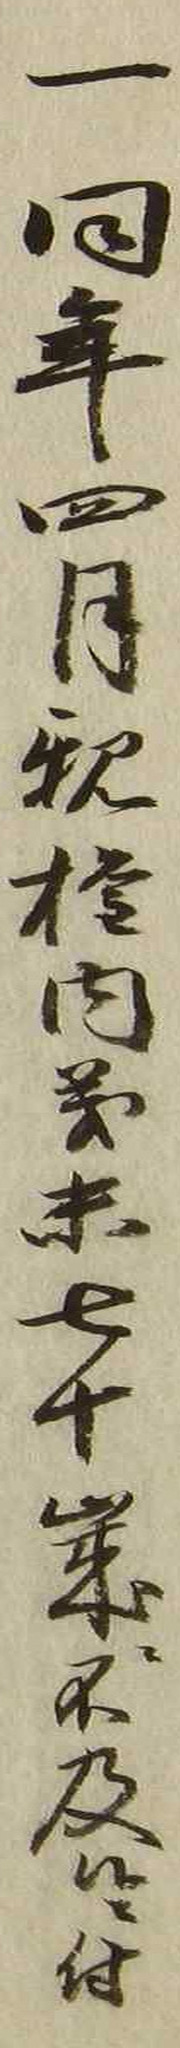一同年四月親権内義未七十歳ニ不及候ニ付
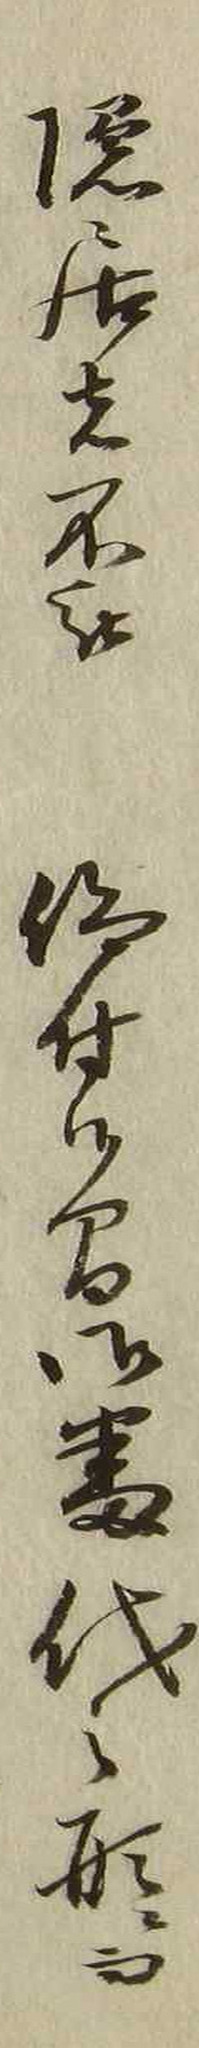隠居者不被仰付候間御番代候形ニ而
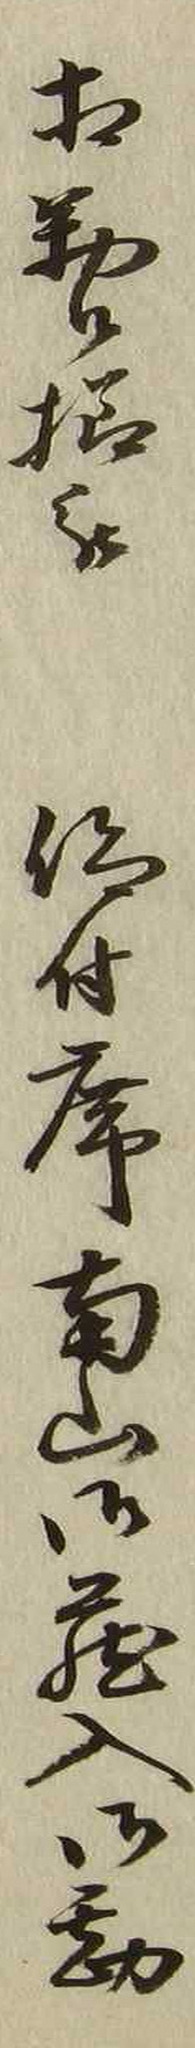相勤候様被仰付席南山御蔵入御勘
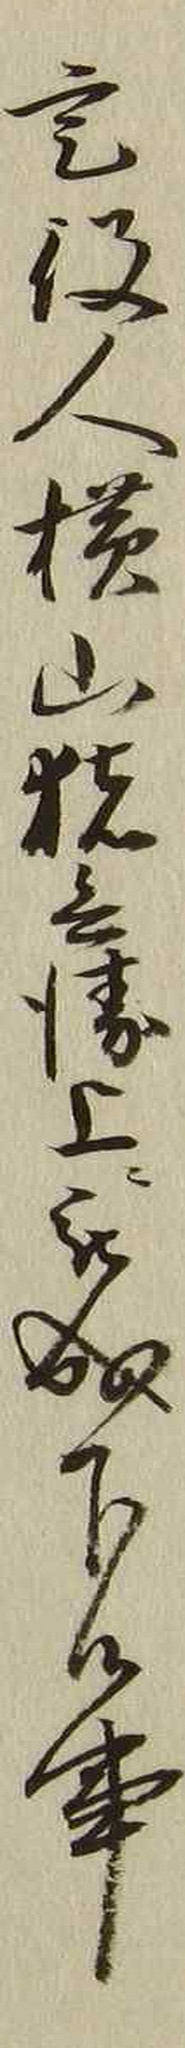定役人横山猪兵衛上ニ被成下候事
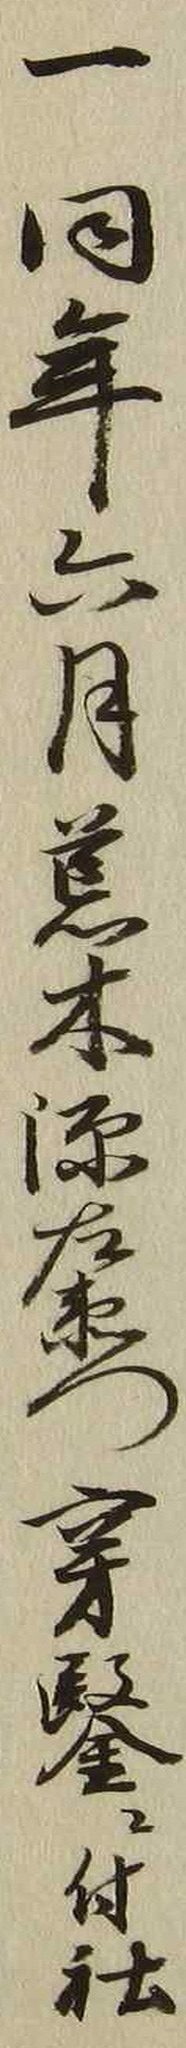一同年六月荒木源左衛門穿鑿ニ付社
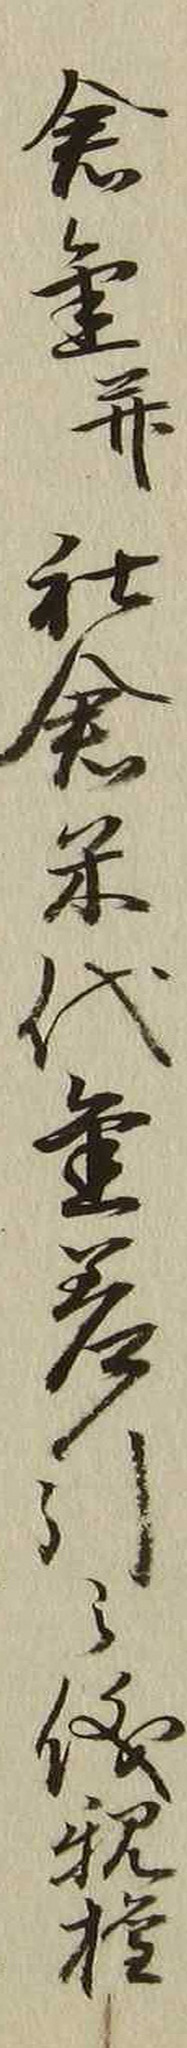倉金幷社倉米代金差引之儀親権
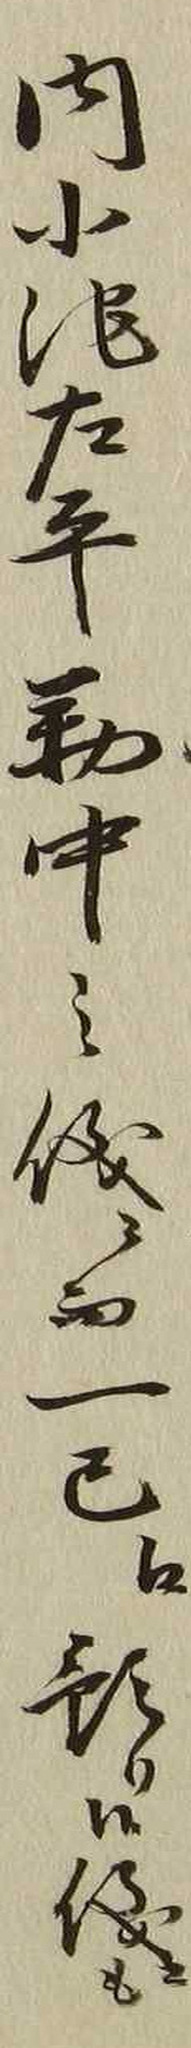内小池佐平勤中之儀ニ而一己江預り候儀ニも
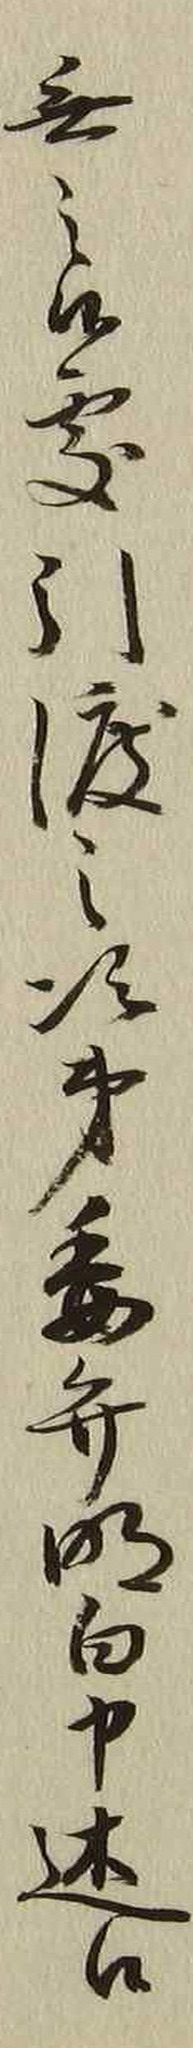無之候処引渡之次第委弁明白申述候
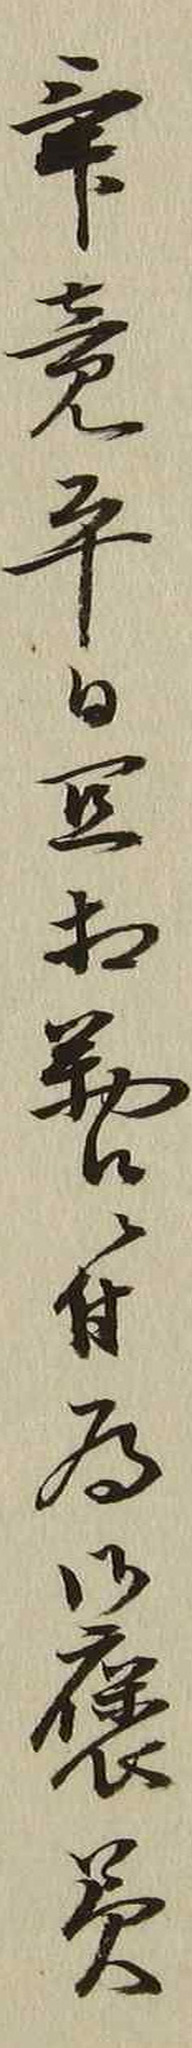畢竟平日宜相勤候ニ付為御褒美
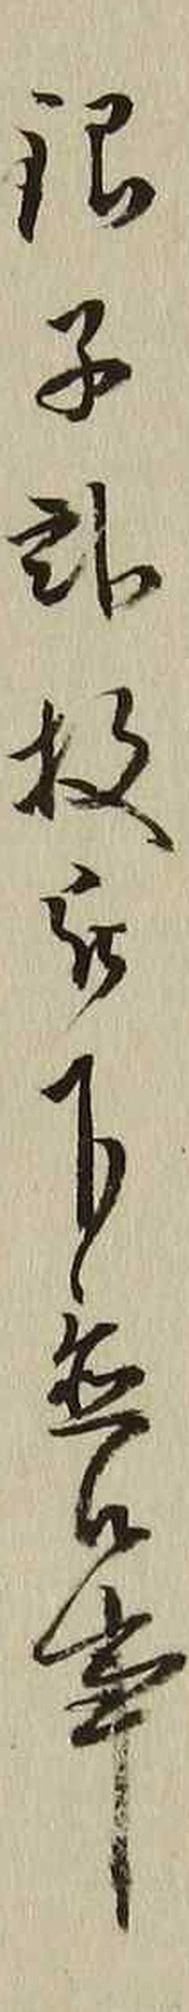銀子弐枚被下置候事
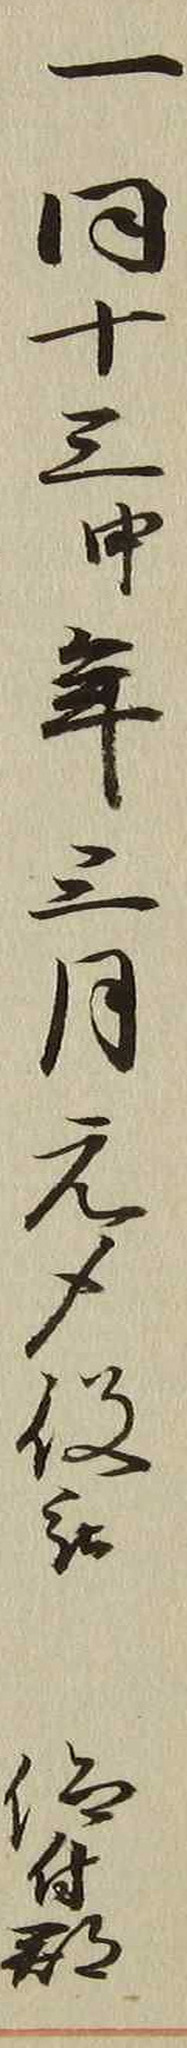一同十三申年三月元〆役被仰付郡
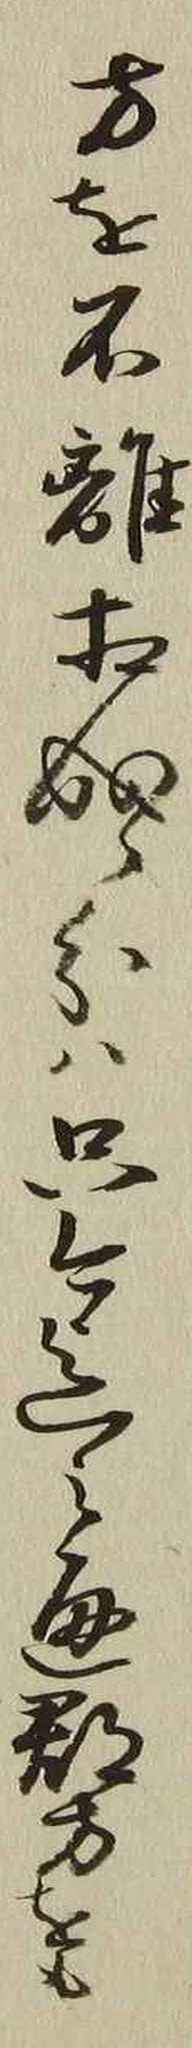方を不離相成候分ハ只今迄之通郡方をも
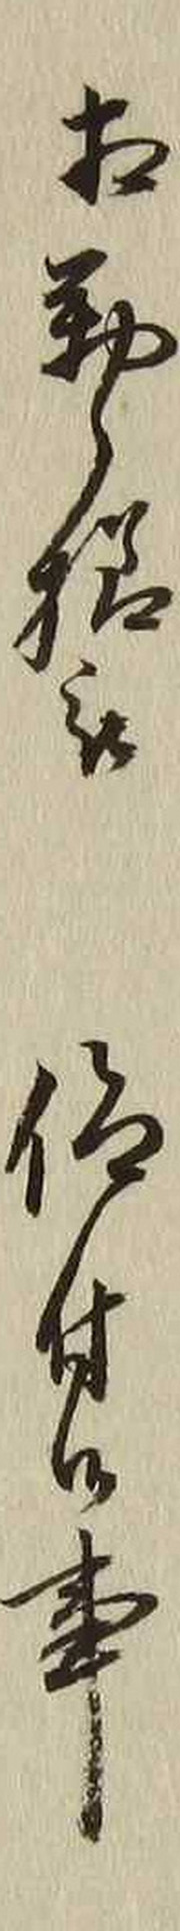相勤候様被仰付候事
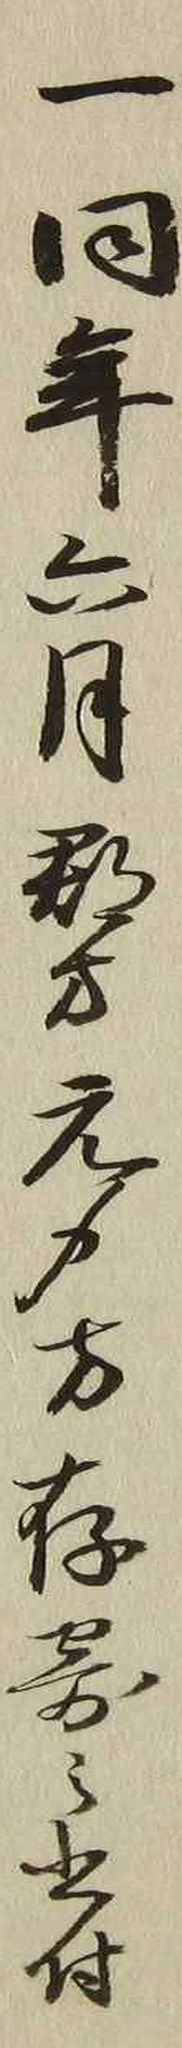一同年六月郡方元〆方存寄之書付
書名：諸士系譜　巻之61　と之部4
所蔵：会津若松市立会津図書館
